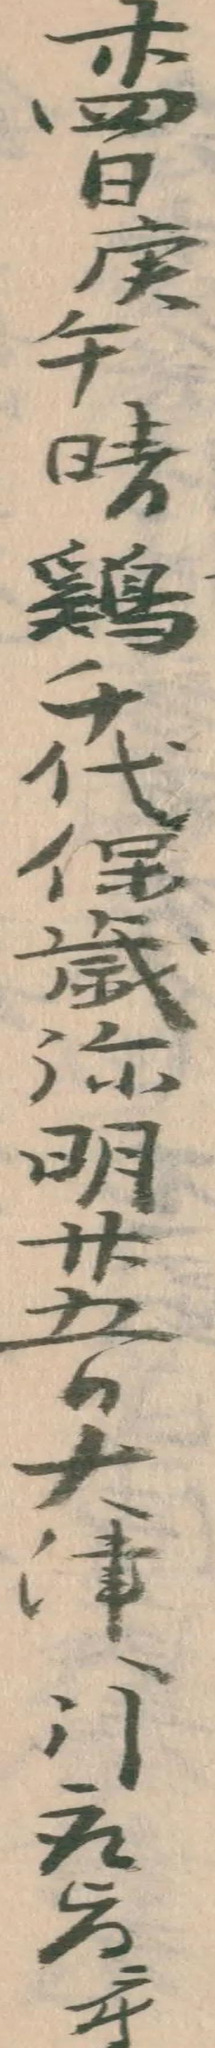廿四日庚午晴鶏千代保歳弥明廿五日大津へ引取旨ニ付
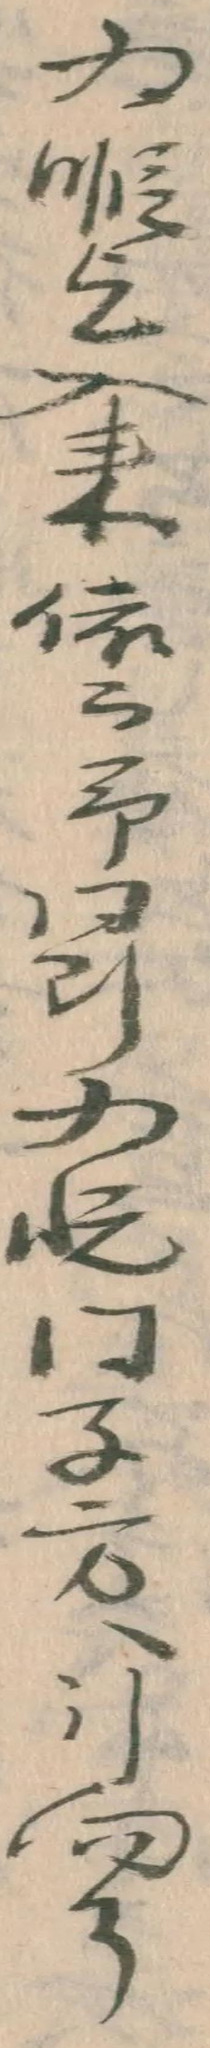為暇乞入来依而予同断為暇同子方へ引向了
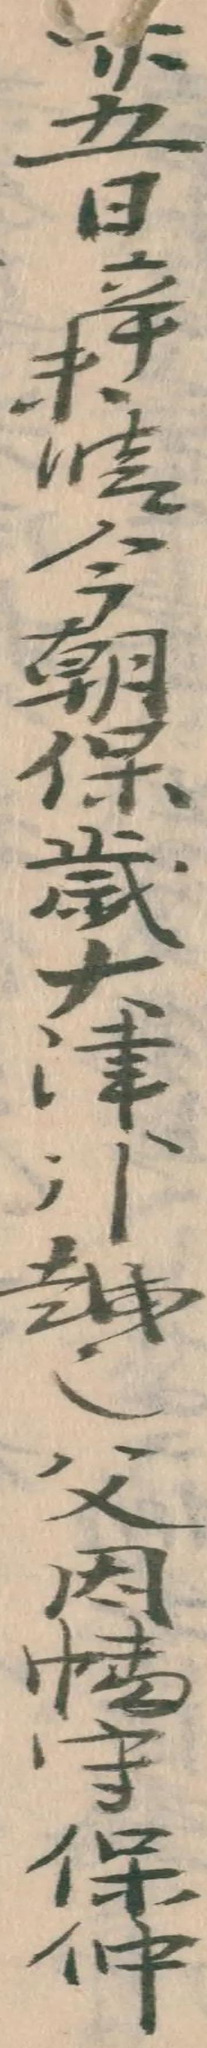廿五日辛亥晴今朝保歳大津ヘ引越也父因幡守保仲
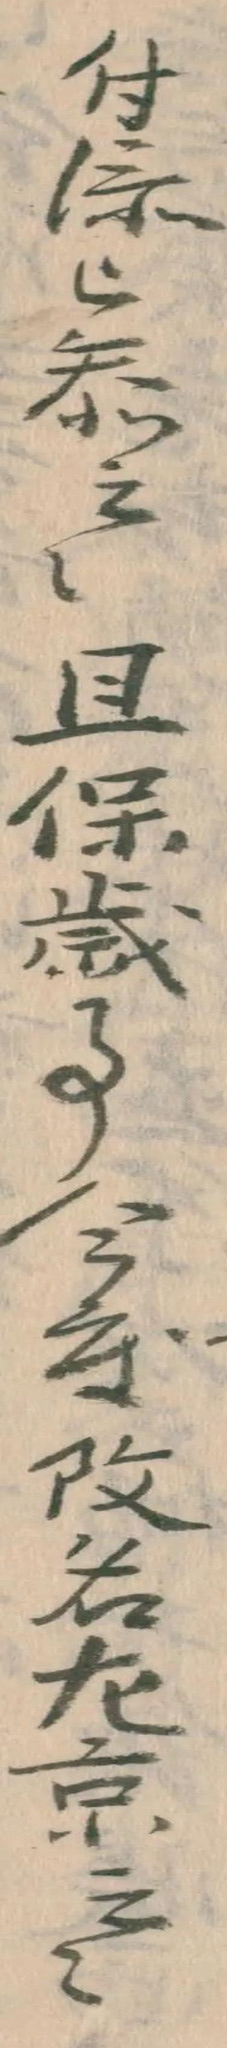付添被参云々且保歳事今度改名左京云々
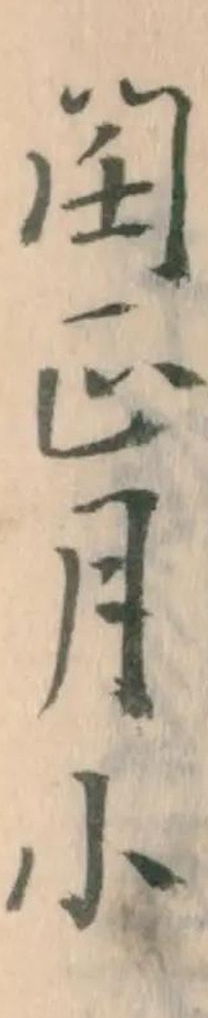閏正月小
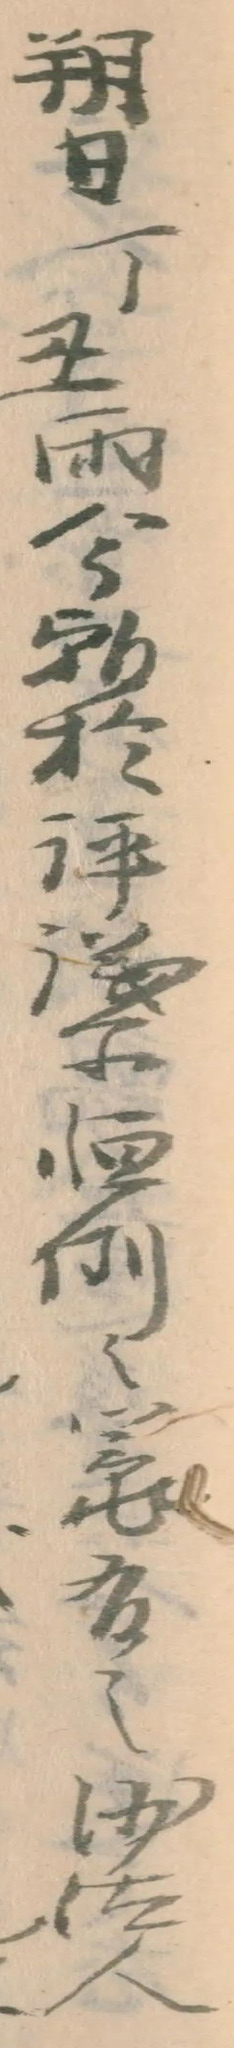朔日丁丑雨今朝於評議所例之鬮有之沙汰人
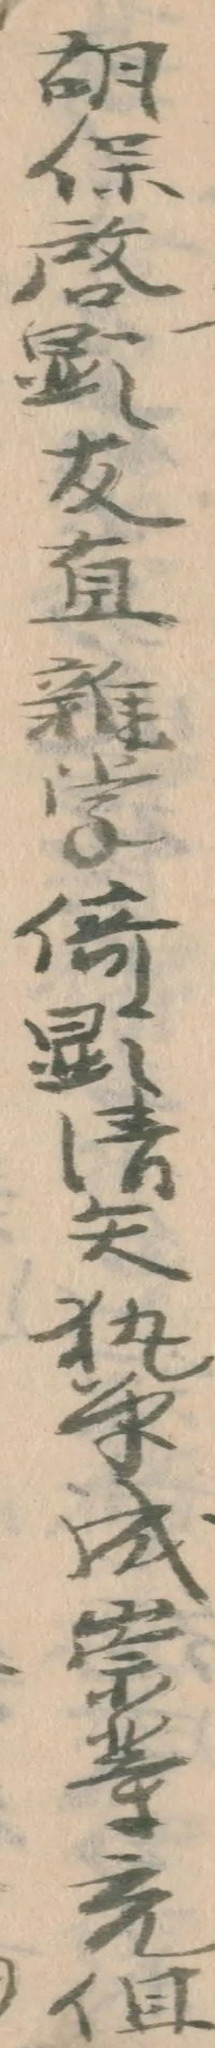胡保啓顕友直雑掌倚顕清矢執筆成崇等充但
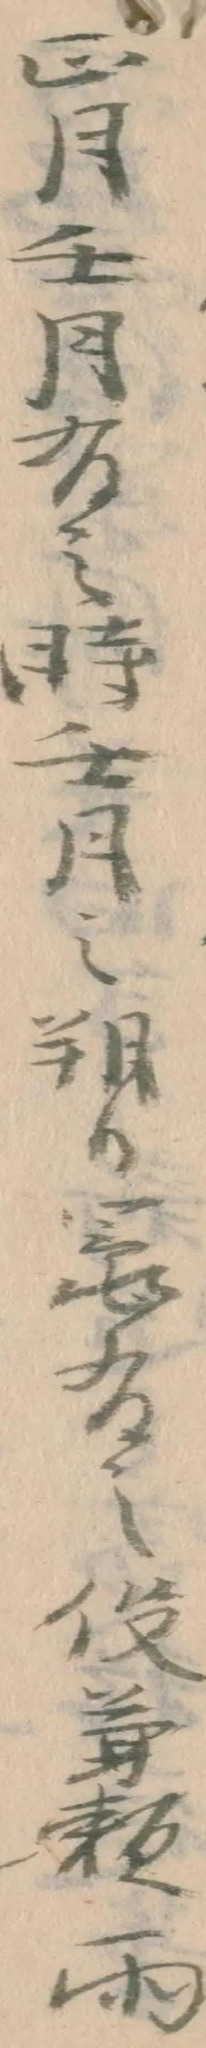正月壬月有之時壬月之朔日鬮有之役兼頼両
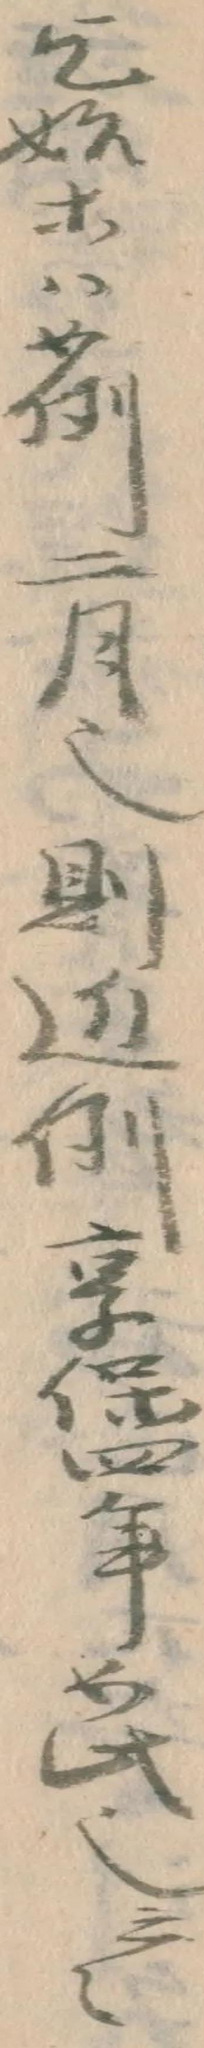乞始等ハ如例二月也則近例享保四年如此也云〻
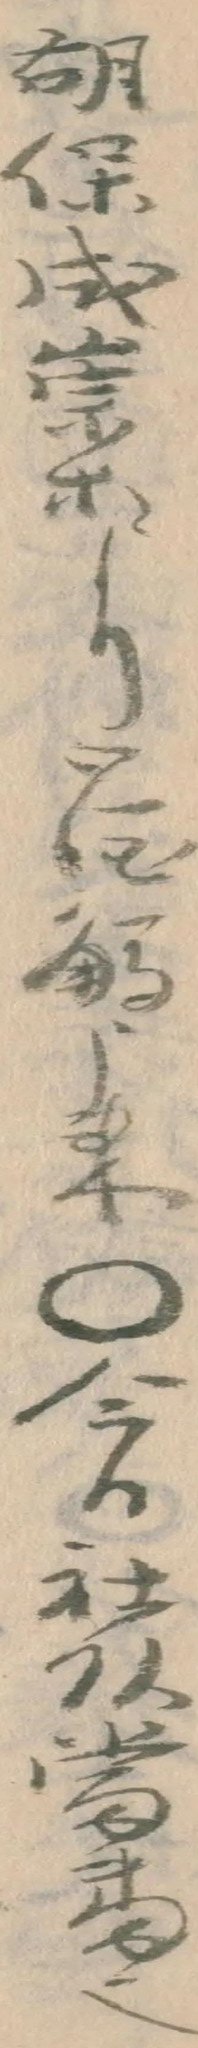胡保成祟等より御注触申来〇今日社頭當番也
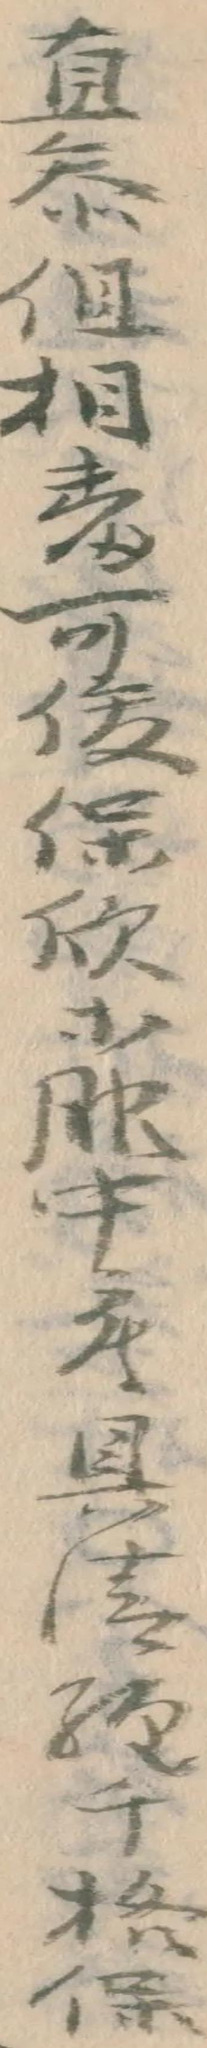直参但相番可俊保欣御服中ニ付具清経千格保
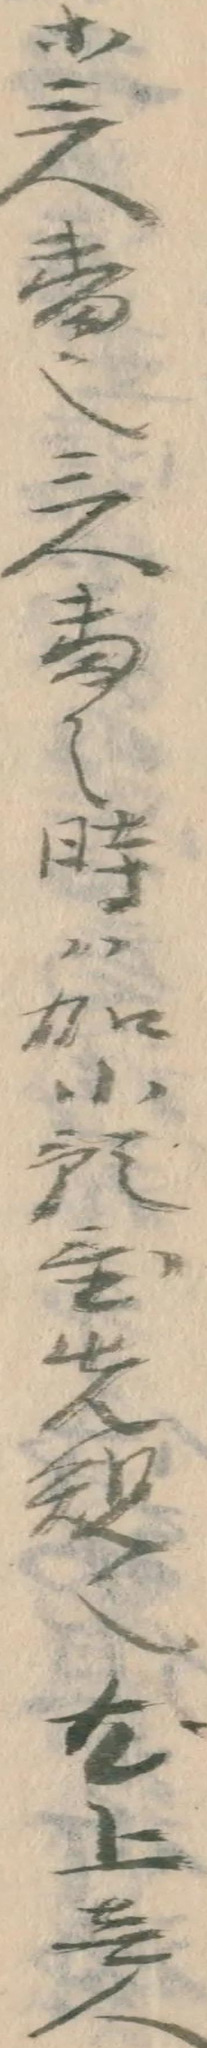等三人番也三人番之時ハ加小預置先規也尤上壱人
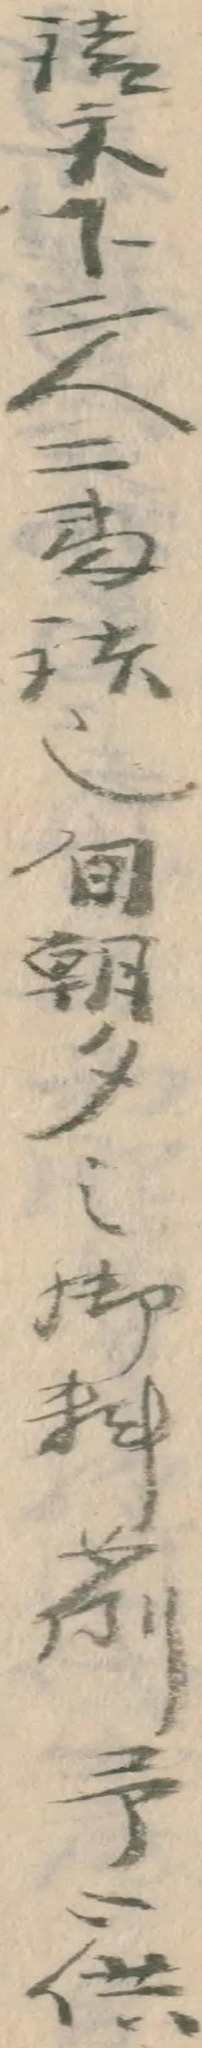請取下二人二番請也旬朝夕之御料如例予御供
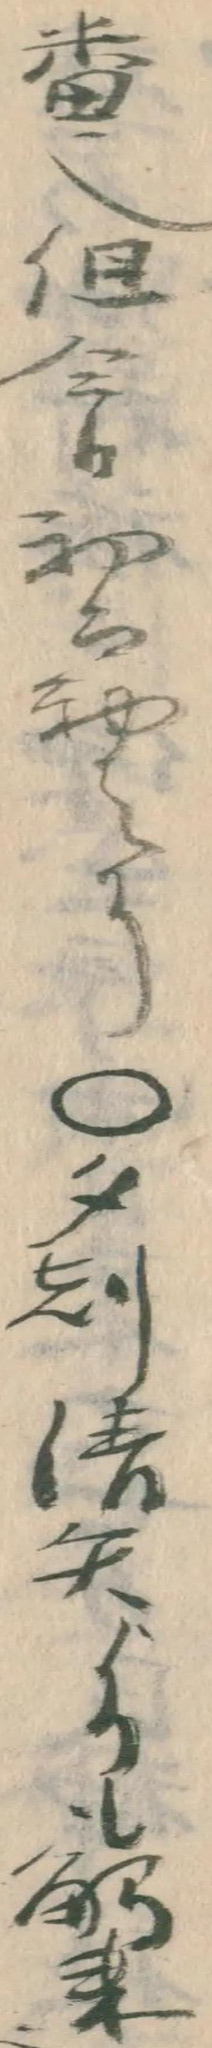番也但今日初而勤候了○夕刻清矢よりも触来也
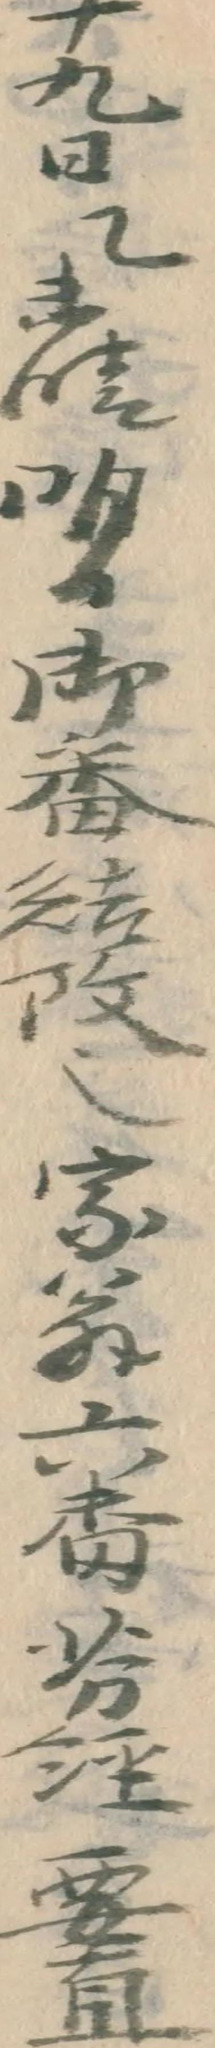十九日己未晴明日御番結改也家翁六番芬経要直
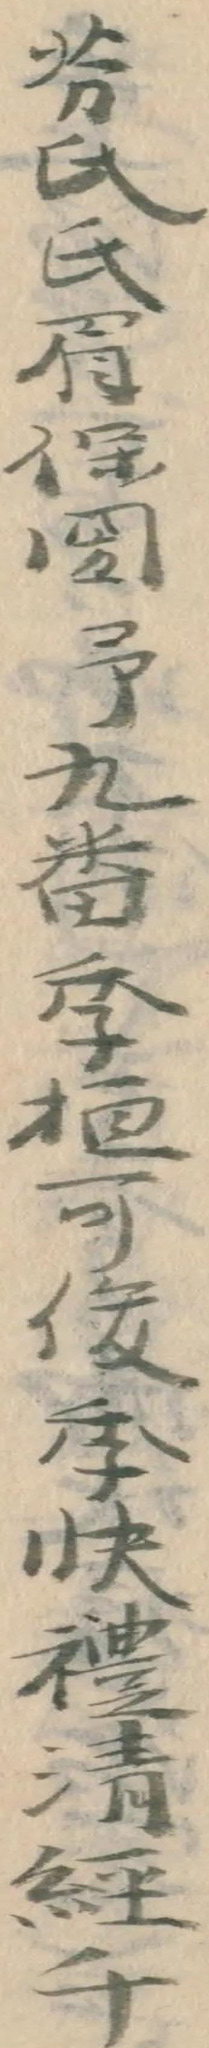芬氏氏眉保圀予九番季桓可俊季快禮清経千
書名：賀茂社記録. 第63冊
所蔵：国立国会図書館 National Diet Library, JAPAN
